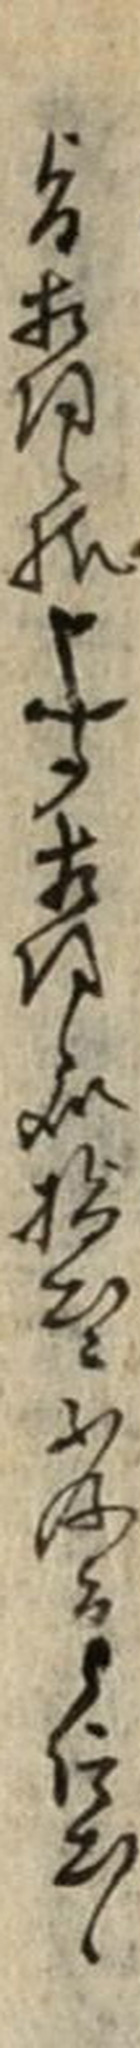旨相伺候様申聞相伺候処指出に不及旨被仰出候
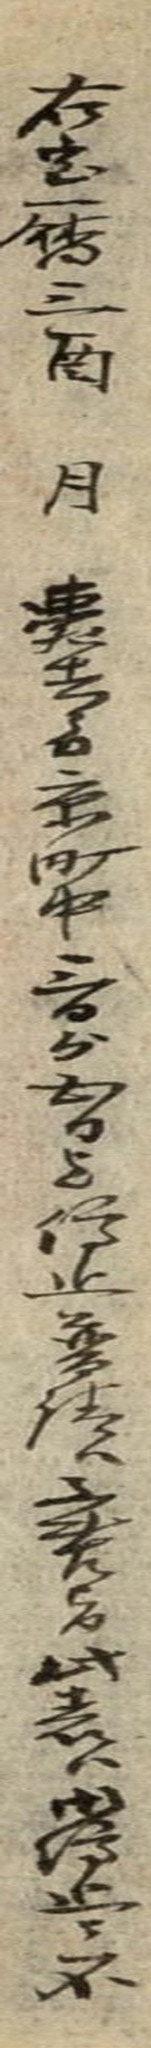右宝暦三酉月薨去に付京町中三日ゟ五日迄停止普請は不苦旨此表は御停止に不
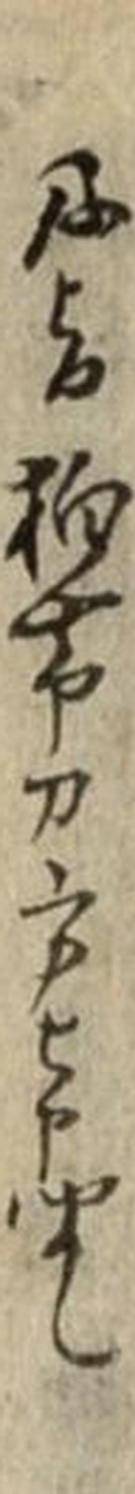及旨狛帯刀方被申聞候
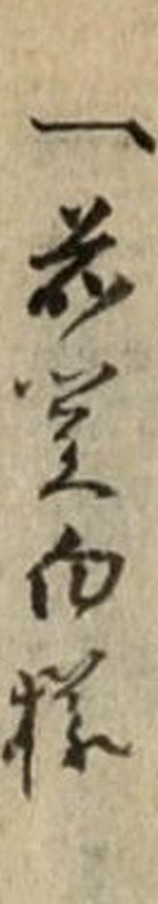一前関白様
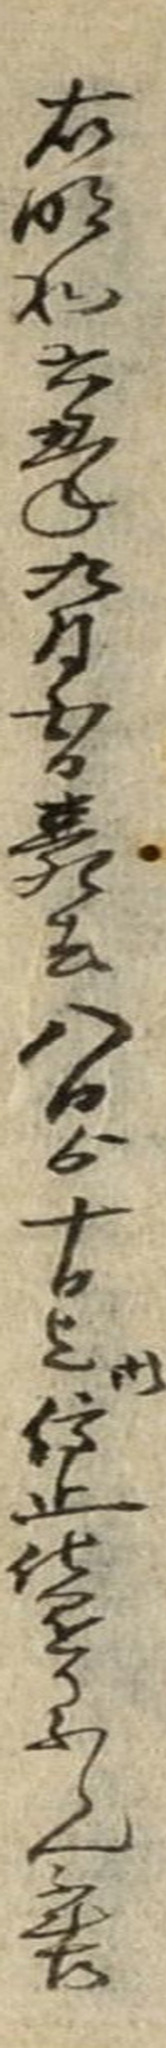右明和六丑年九月五日薨去八日ゟ十日迄御停止仕懸りふしん不苦
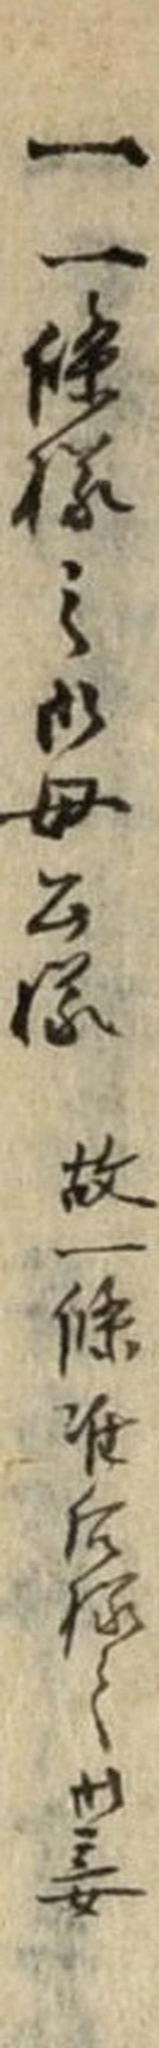一一条様之御母公様故一条准后様之御妾
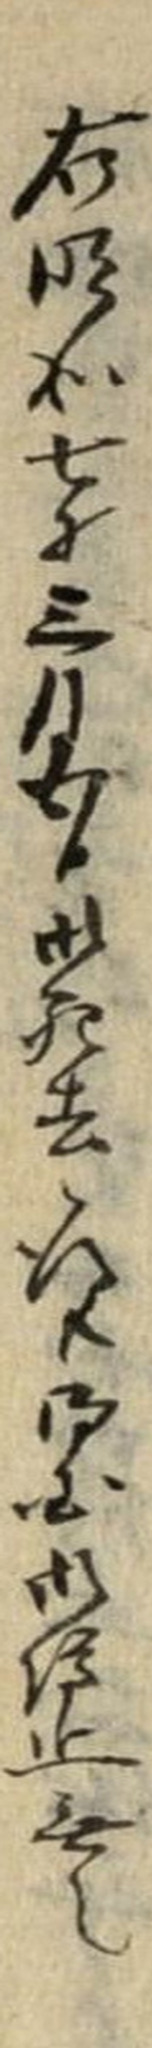右明和七刁三月五日御死去候得共御国御停止無之
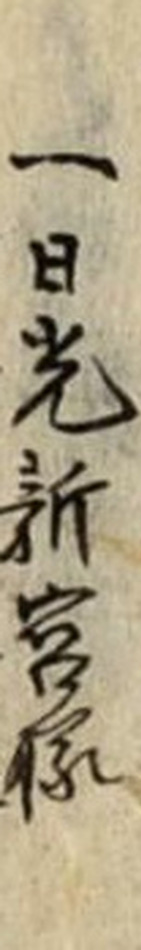一日光新宮様
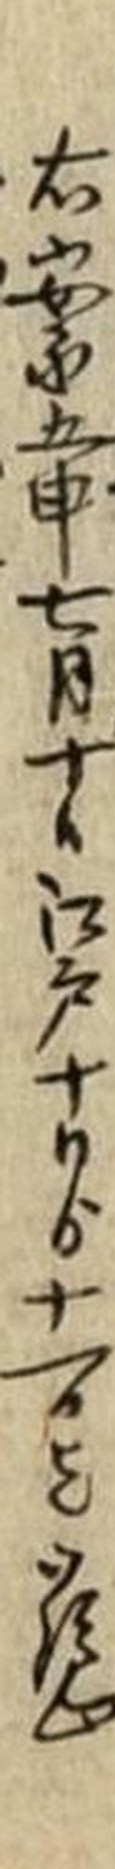右安永五申七月十日江戸十日ゟ十一日迄御停止
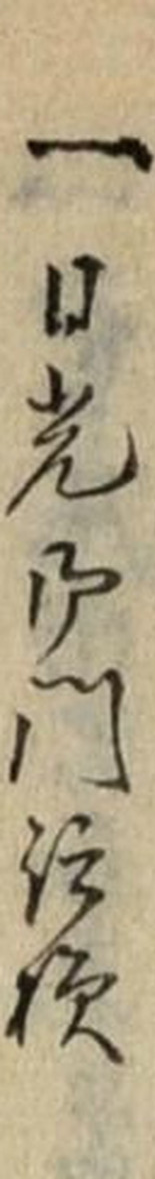一日光御門跡様
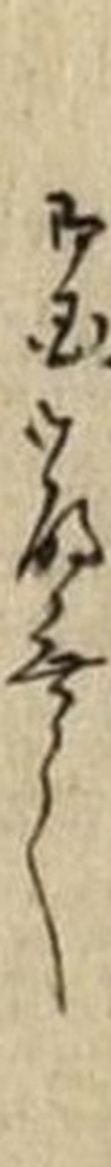御国御触無之
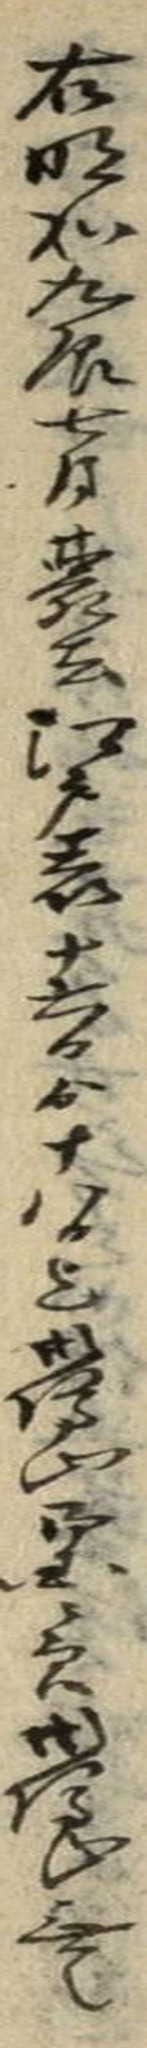右明和九辰七月薨去江戸表十六日ゟ十八日迄御停止御国にては御停止無之
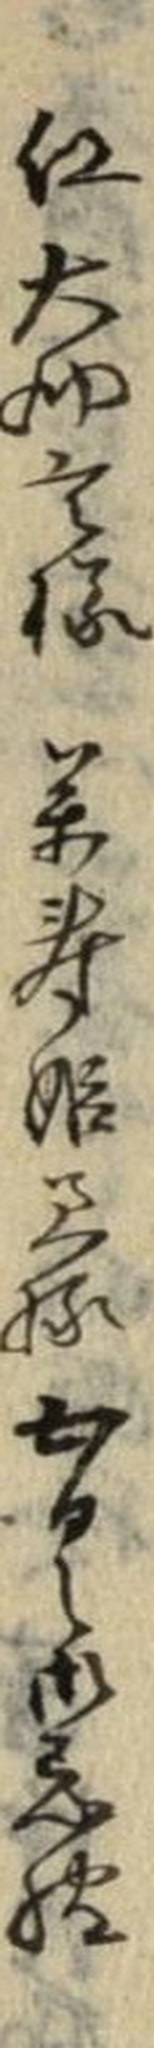但大納言様万寿姫君様五日之御忌服
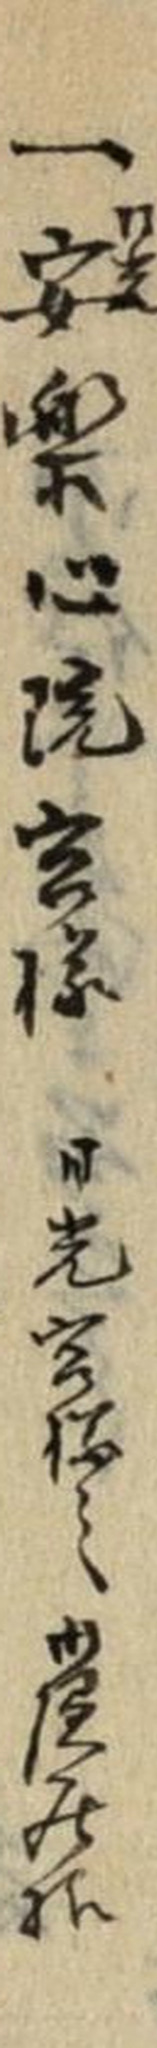一歓喜心院宮様日光宮様之御隠居様
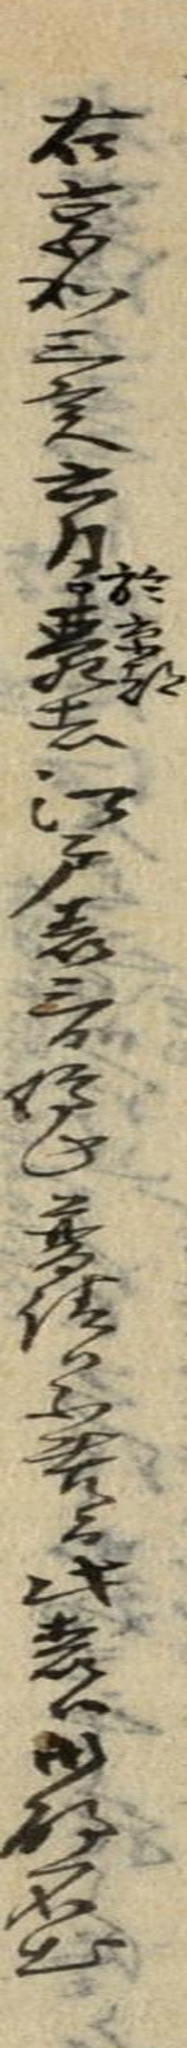右享和三亥六月◦薨於京都去江戸表三日停止普請は不苦旨此表は御触不出
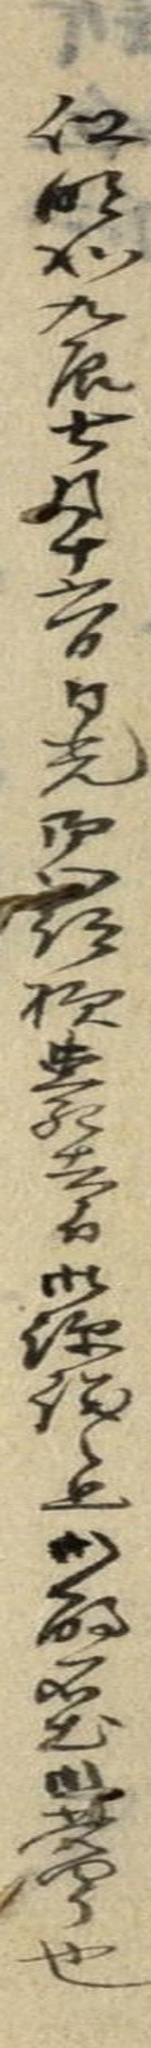但明和九辰七月十六日日光御門跡様薨去に付御評議之上御触不出御当り也
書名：御停止異変死失
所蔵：福井県文書館 Fukui Prefectural Archives
